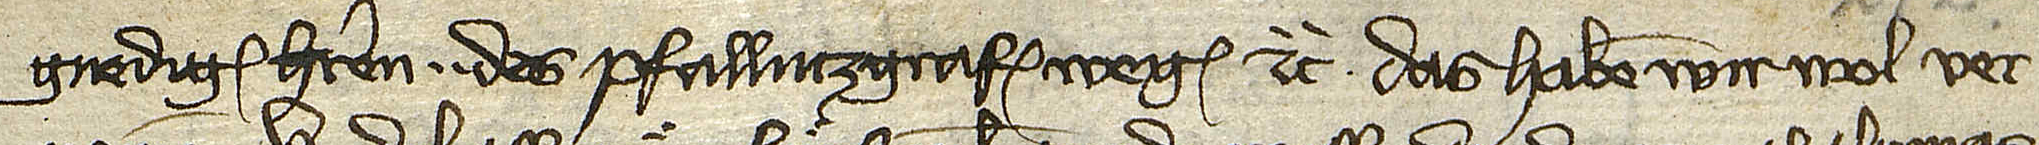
gnedig* hr*en ~ des pfallncʒgraf* weg* ec* . das habe* wir wol ver =
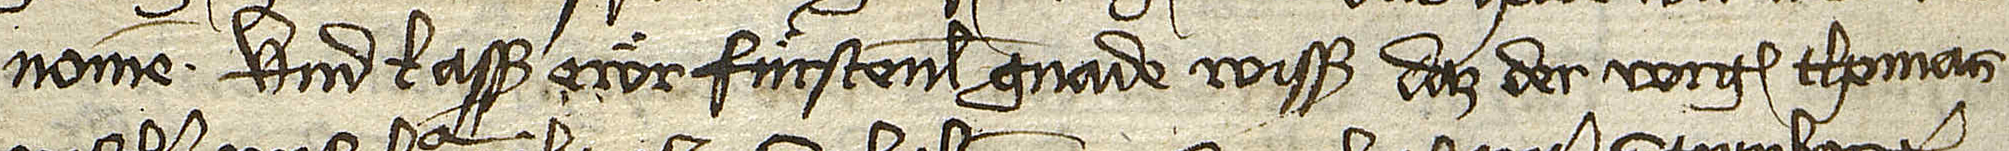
nome*. Vnd laſſ* ewr fürſtenl* gnade wiſſ* daʒ der vorg* thomas
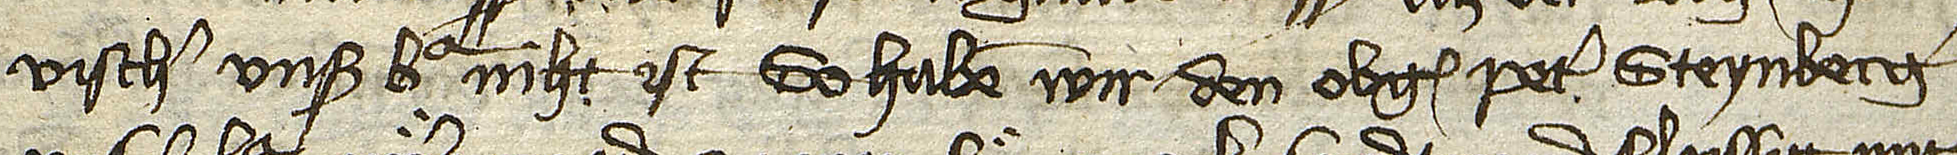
viſch* vnſ* b* niht iſt So habe* wir den obg* pet* Steynberg*
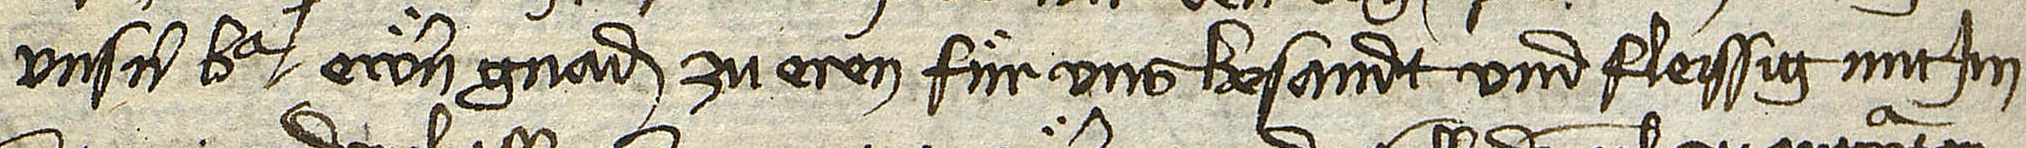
vnſn* b* ew*n gnad* ʒu eren für vns beſandt vnd fleiſſig mit Im
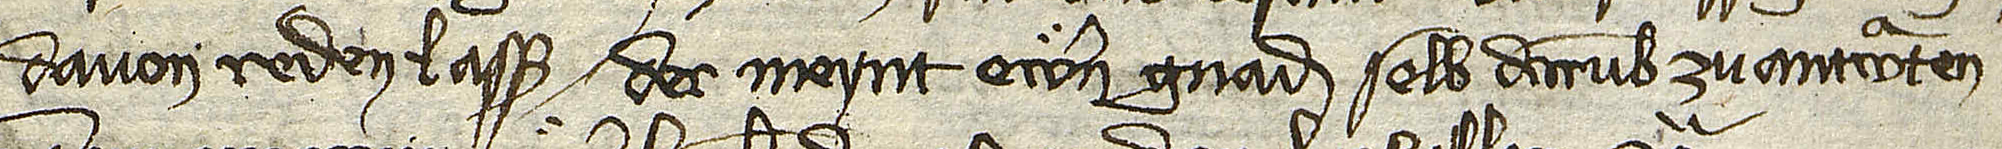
dauon reden laſſ* der meynt ew*n gnad* ſelb darub* ʒu antw*ten
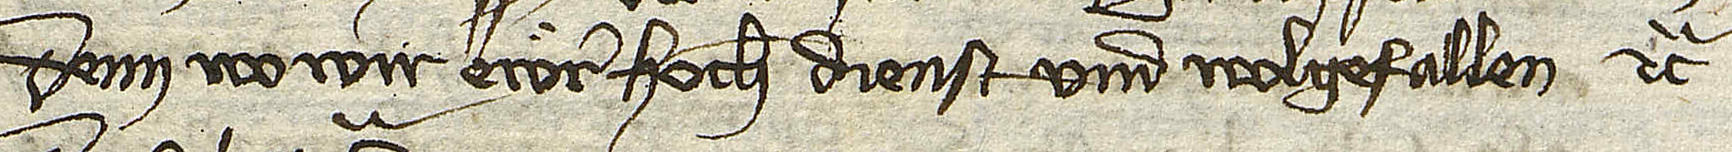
Denn wo wir ewr* hoch* dienſt vnd wolgefallen ec*
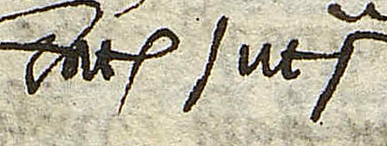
Dat* / ut ſ*
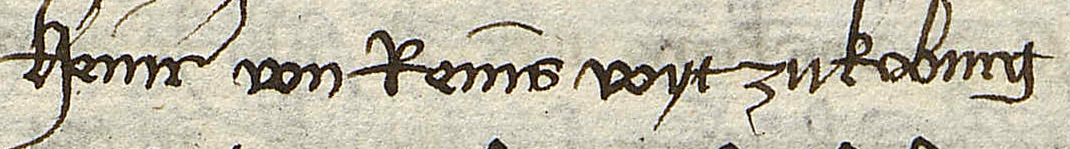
Heinr* von Reni*s voyt ʒu Koburg
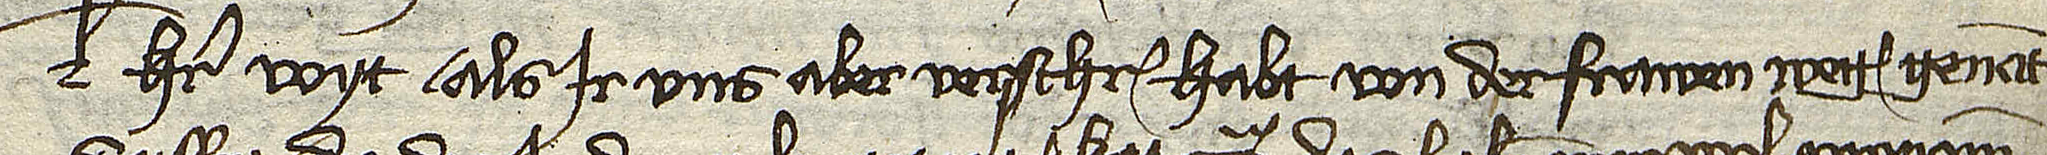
L* Hr* voyt / als Ir vns aber verſchr* habt von der frawen weg* genat*
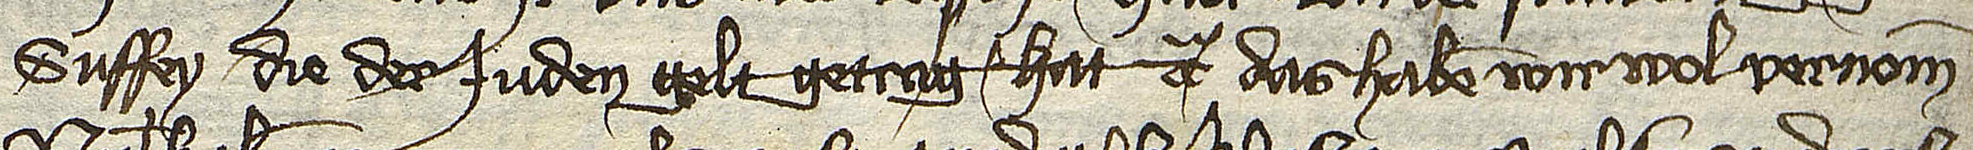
Suffey / die der Iuden gelt getrag* hat ec* das habe* wir wol vernom*
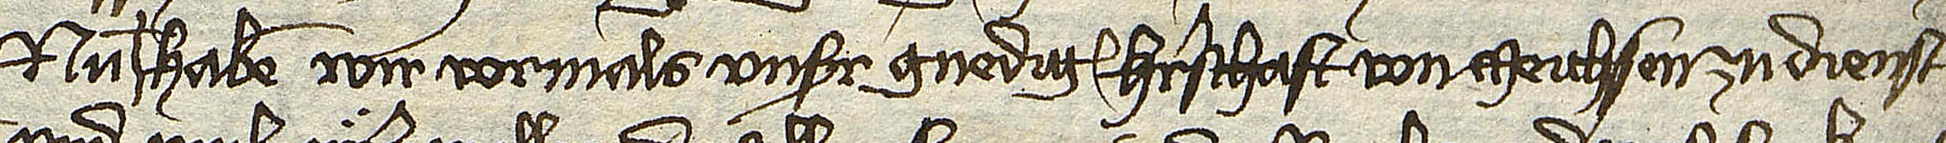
Nu habe* wir vormals vnſ*r gnedig* Hr*schaft von Meichſen ʒu dienſt
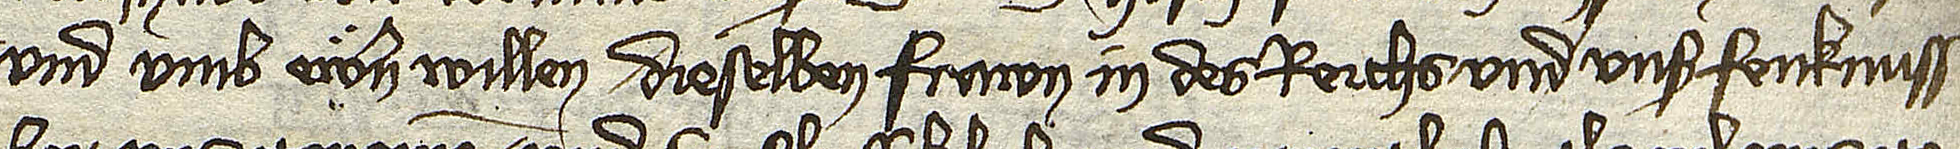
vnd vmb ew*n willen dieſelben frawn in des Reichs vnd vnſ* fenknuſſ
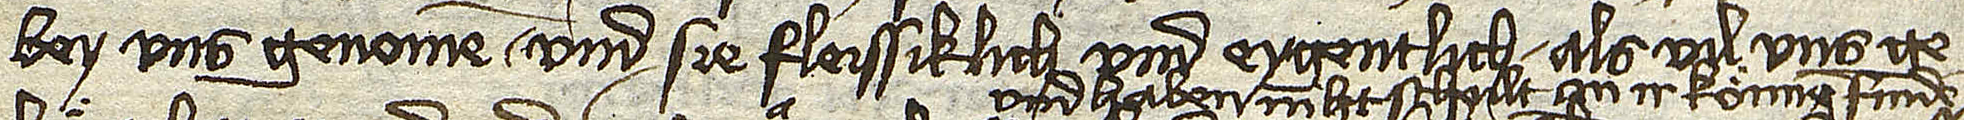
bey vns genome* vnd ſie fleiſſiklich vnd eygentlich / als vil vns ge
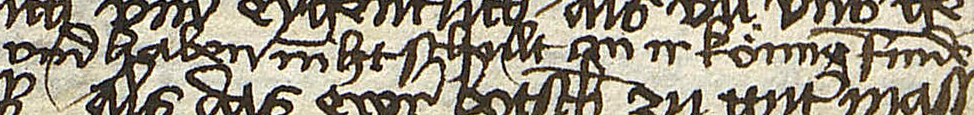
vnd haben niht ſchult an ir könne* finde*
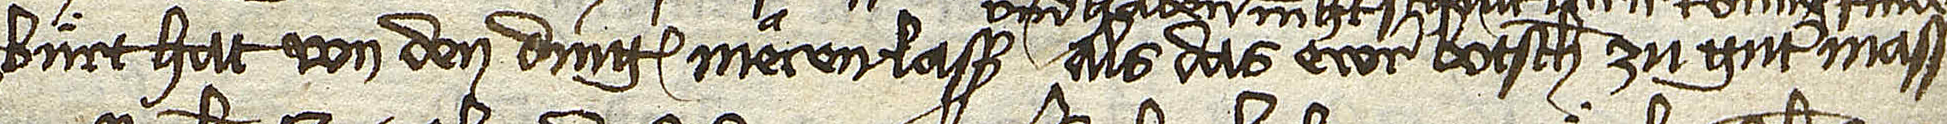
bürt hat von den ding* mëren laſſ* als das ewr* botſch* ʒu gut* maſſ
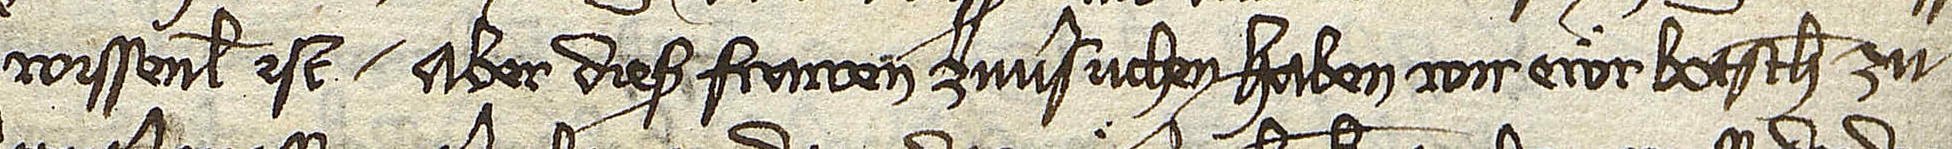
wiſſenl* iſt / Aber dieſ* frawen ʒuu*ſuchen haben wir ewr botſch* ʒu
